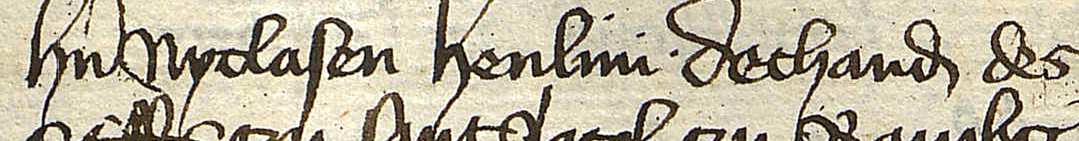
H*n Nyclaſen Henlini . Dechand* des
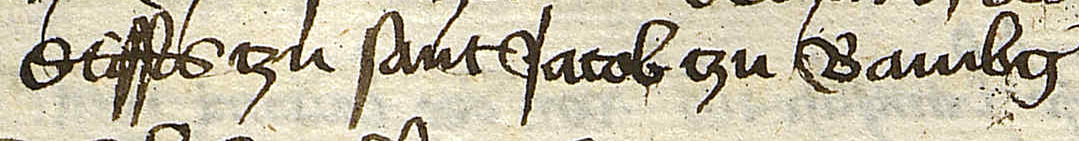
Stiffts cʒu ſant Iacob cʒu Bamb*g
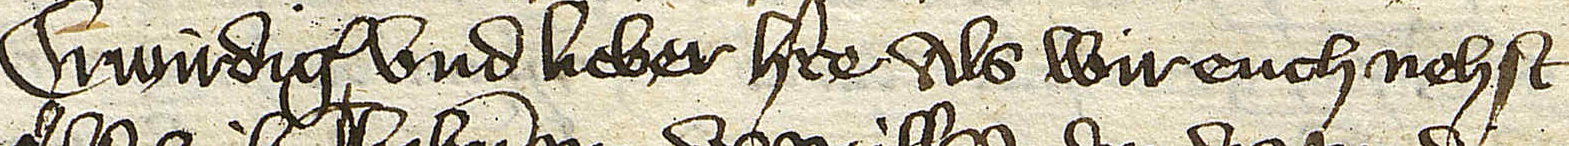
Erwirdig* vnd lieber h*re . Als wir euch nehſt
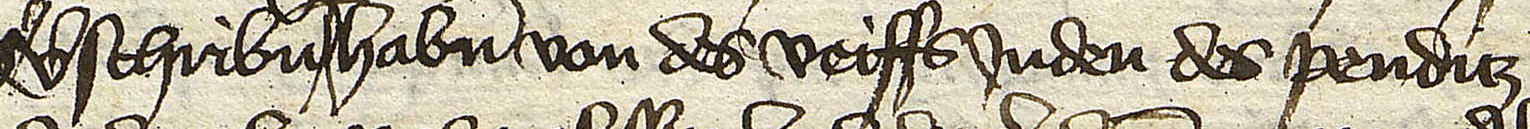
v*ſchrib*n hab*n von des veiffs Iuden des pendicʒ
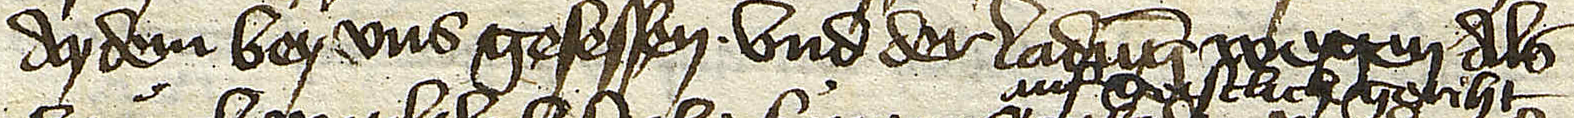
Aydem bey vns geſeſſen . vnd der ladu*g wegen Als
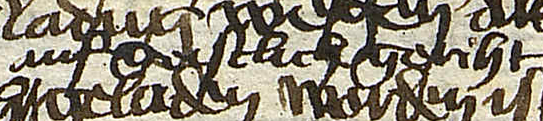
auf geiſtlich geriht
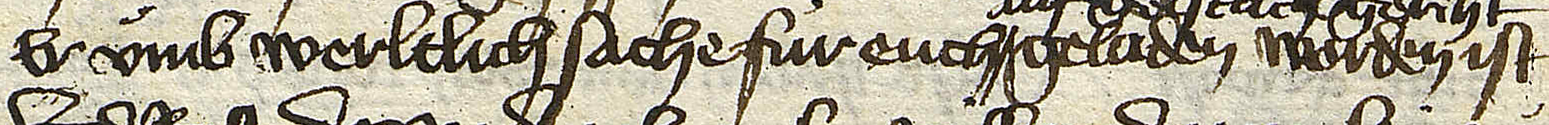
Er v̈mb werltlich ſache für euch geladen worden iſt
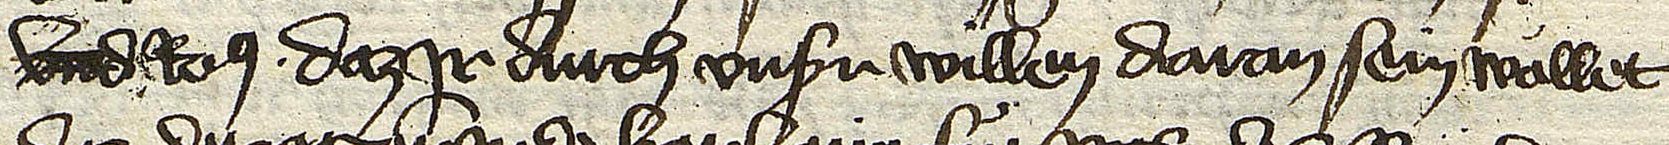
Vnd Ro* . daʒ Ir durch vnſ*n willen daran ſein wöllet
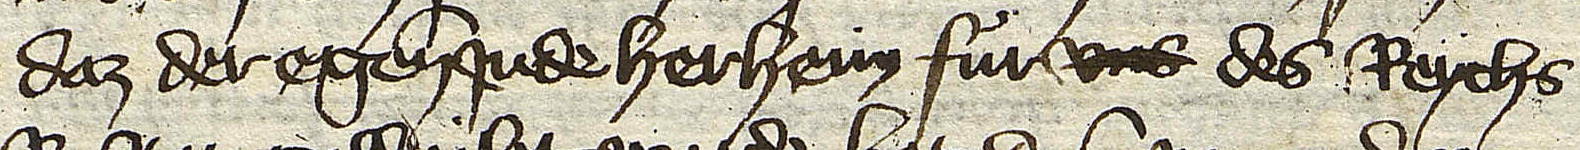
daʒ der egen* Iude herheim für vns des Reychs
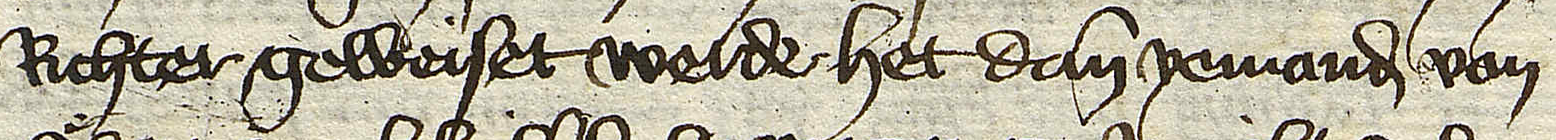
Richter geweiſet werde . het dan* yemand* von
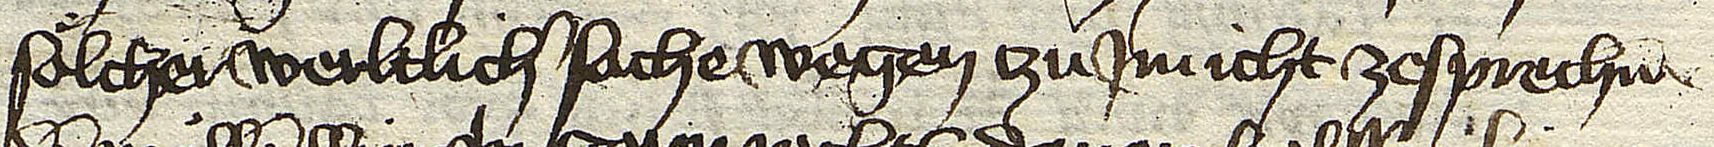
ſölcher werltlich* ſache wegen cʒu Im icht cʒeſprech*n
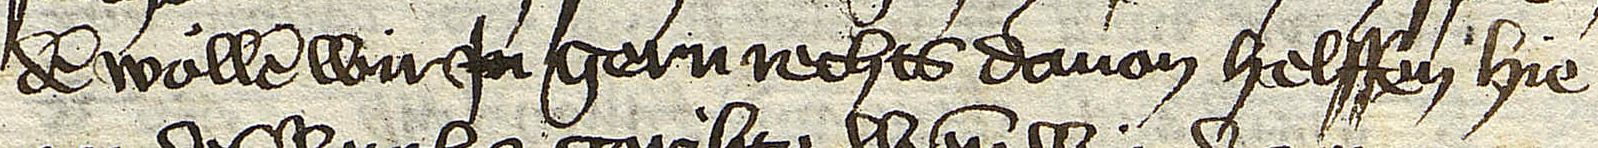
d* wölle* wir In gern rechts dauon helffen hie
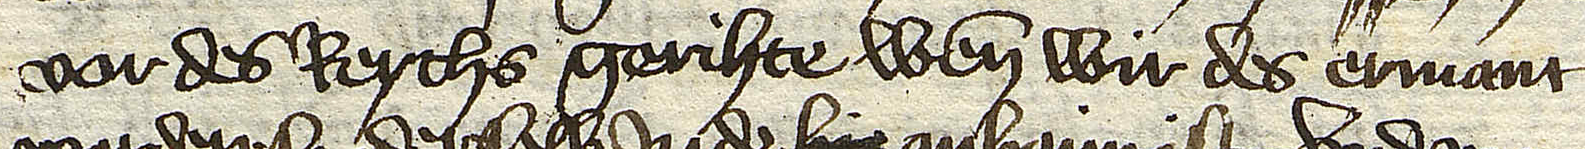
vor des Reychs gerihte wen* wir des ermant
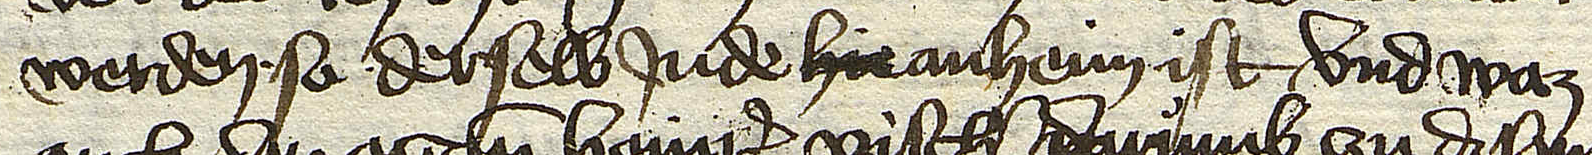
werden . ſo . derſelb Iude hie anheim iſt / Vnd waʒ
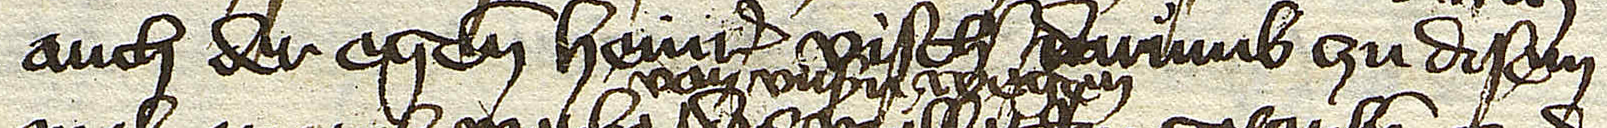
auch der egen* heinr* viſch* darümb cʒu diſem
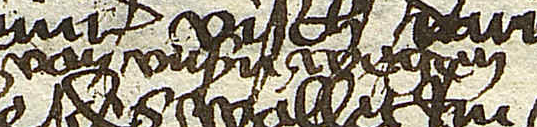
von vnſ*n wegen
